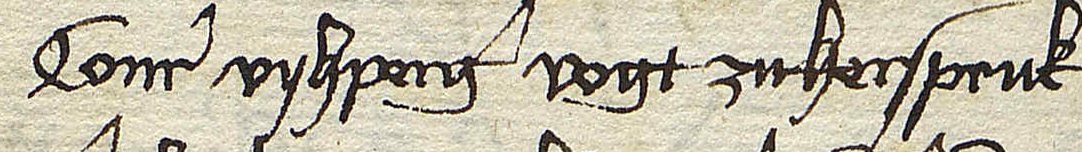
Conr* vyhperg* vogt ʒu herſpruk
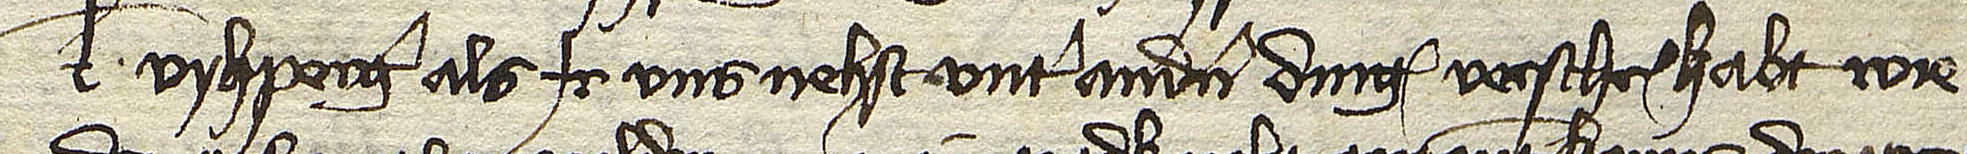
L* vyhperg* als Ir vns nehſt vnt* andn* ding* verſchr* habt wie
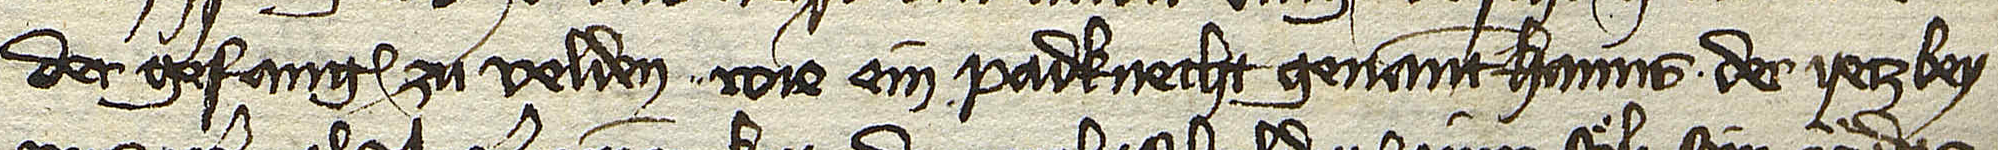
der gefang* ʒu velden . wie ein padknecht genant* hanns . der yecʒ bey
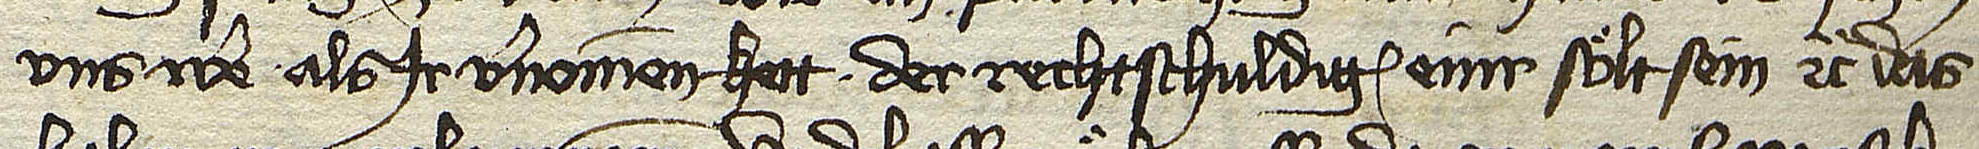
vns we* . als Ir v*nomen* hett . der rechtſchuldig* einr ſölt ſein ec* das
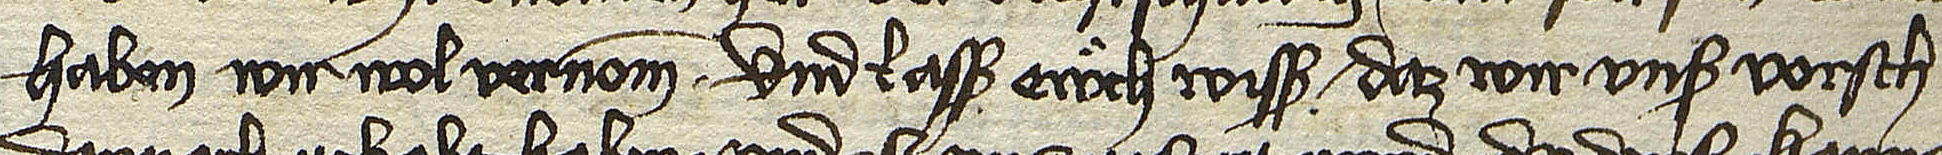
haben wir wol vernom* . Vnd laſſ* ewch wiſſ* / daʒ wir vnſ* vorſch
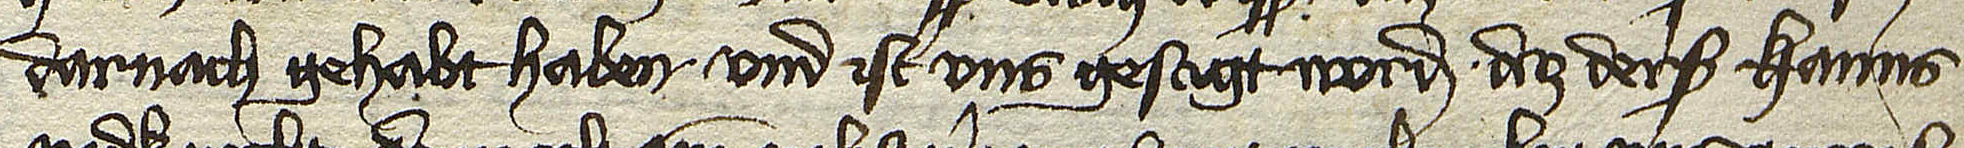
darnach gehabt haben / vnd iſt vns geſagt word* . daʒ derſ* Hanns
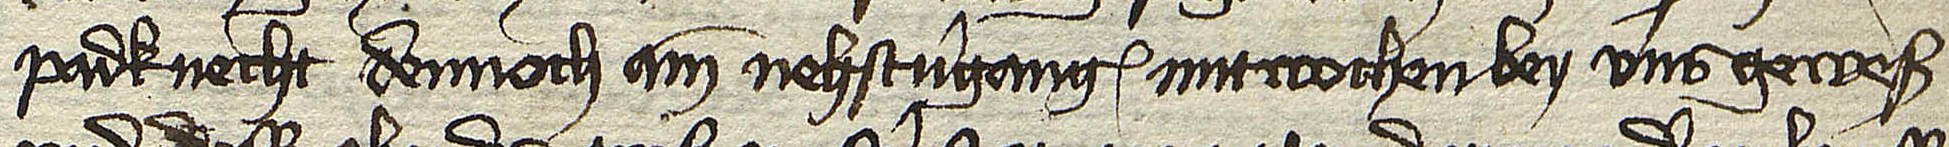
padknecht dennoch am* nehſtu*gang* mitwochen bey vns geweſ*
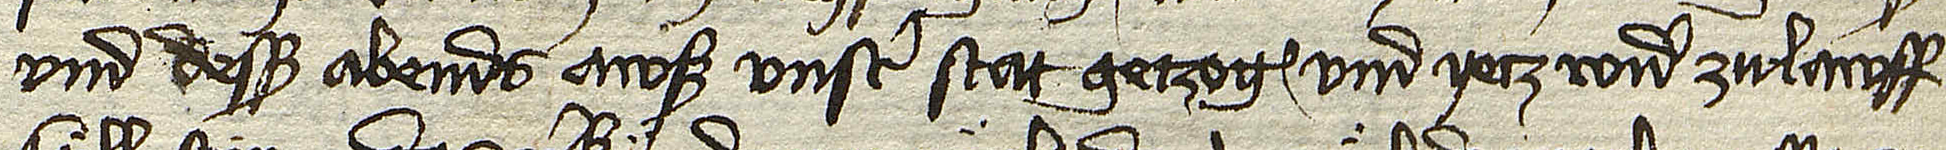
vnd deſſ* abends awſʒ vnſr* ſtat gecʒog* vnd yecʒ wid* ʒulawff
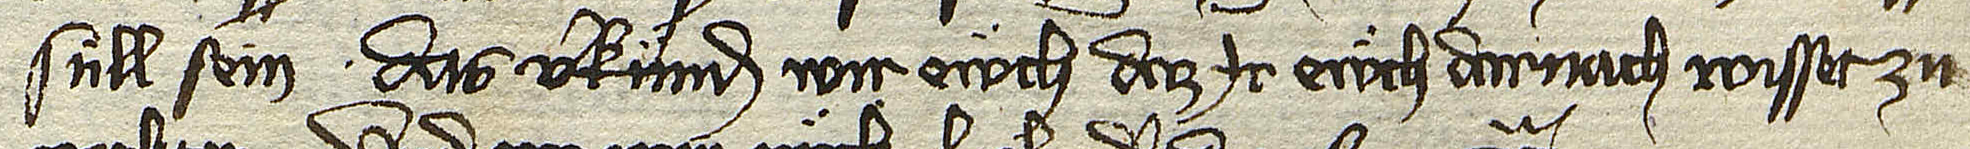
ſüll ſein . das v*künd* wir ewch daʒ Ir ewch darnach wiſſet ʒu
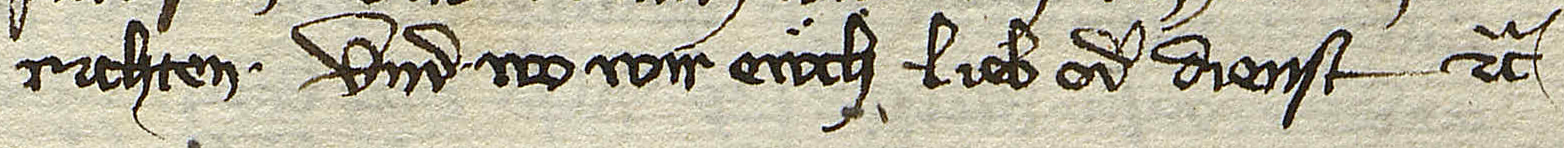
richten. Vnd wo wir ewch lieb od* dienſt ec*
